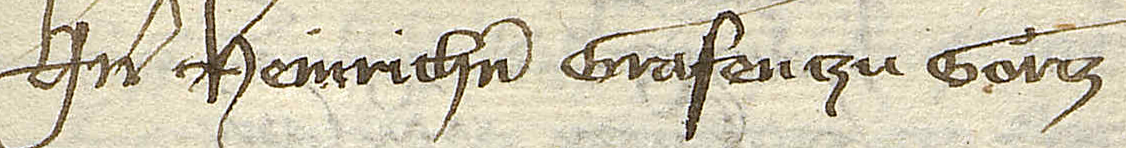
Hn* Heinrich*n Grafen cʒu Görcʒ
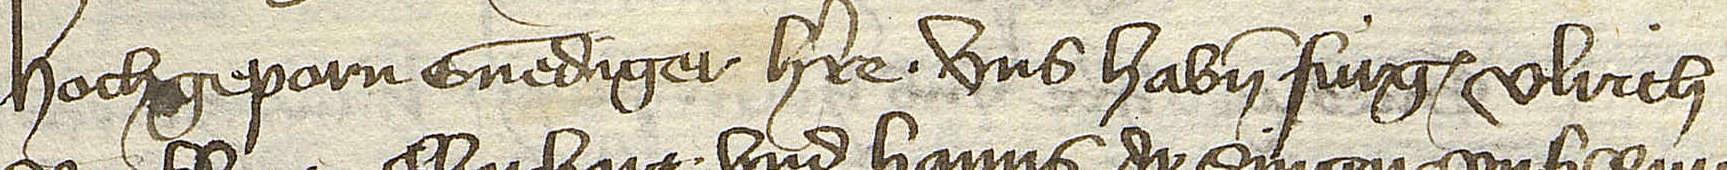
Hochgeporn Gnediger hre* . Vns hab*n fürg* vlrich
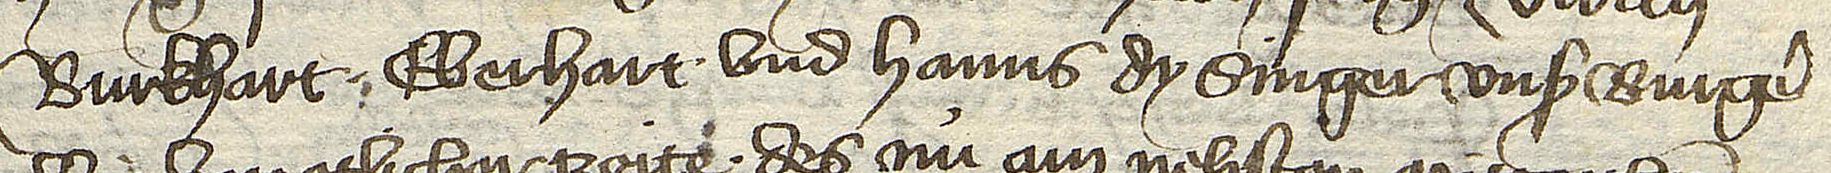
Burkhart . Eberhart vnd hanns dy Singer vnſ* Burge*
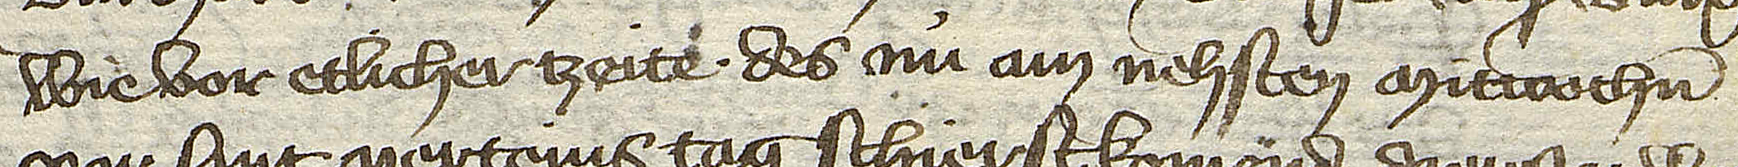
wie vor etlicher cʒeite . des nü am nehſten Mitwoch*n
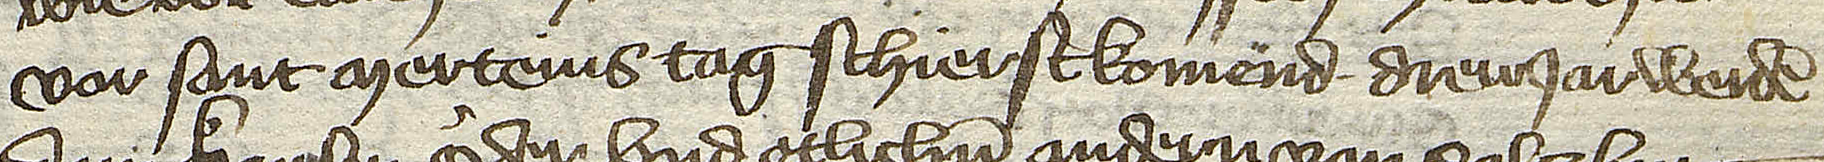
vor ſant Merteins tag ſchierſt komend . drew Iar werde*
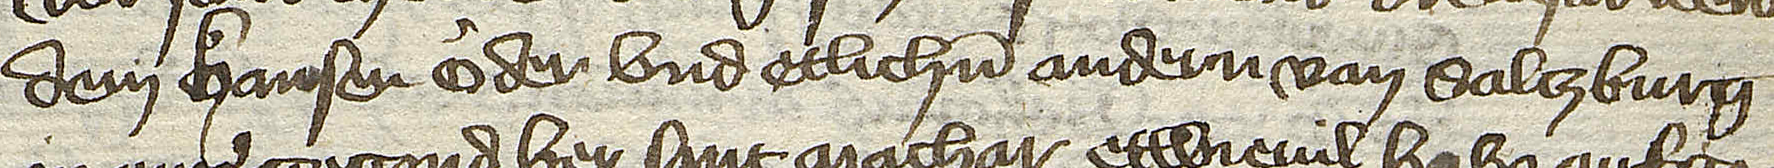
dem hanſen Öder vnd etlich*n andern von Salcʒburg
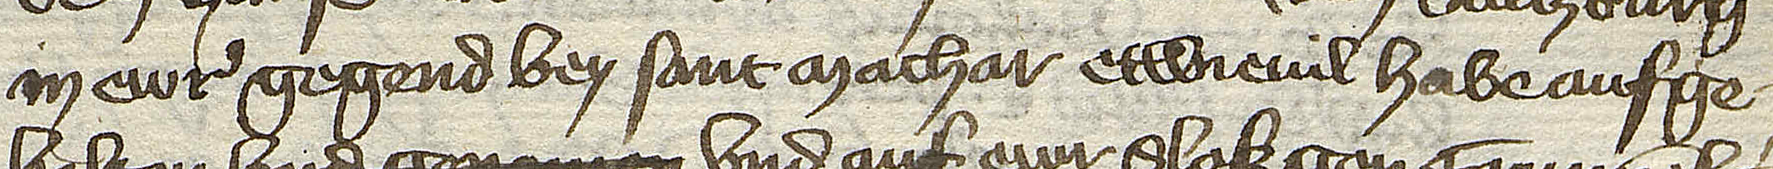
in ewr* gegend bey ſant Machar etwieuil habe aufge -
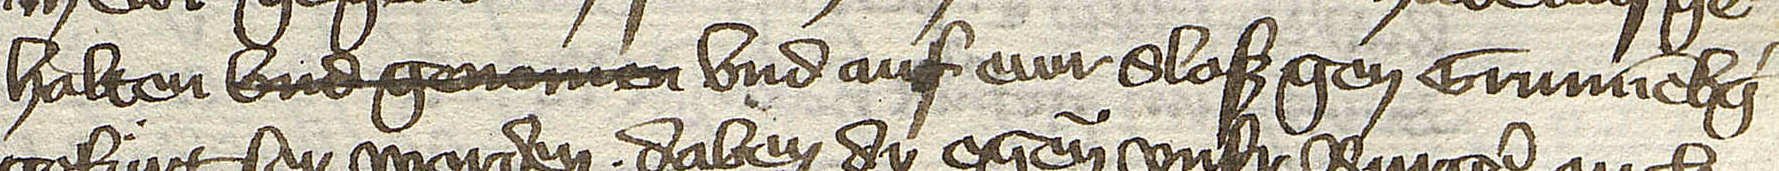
halten vnd genomen vnd auf ewr Sloſʒ gen Grunne*bg*
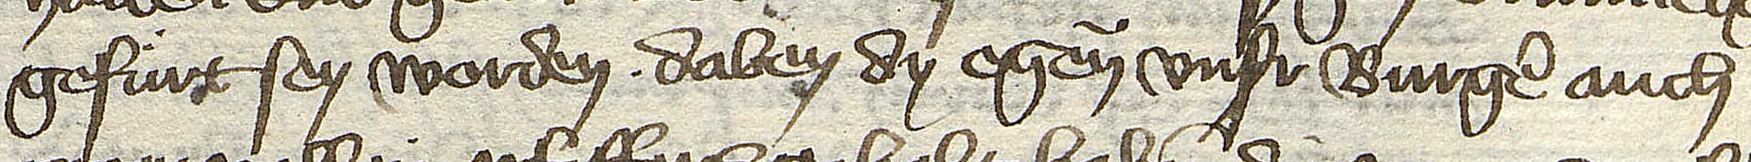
gefürt ſey worden . dabey dy egen* vnſ*r Burge* auch
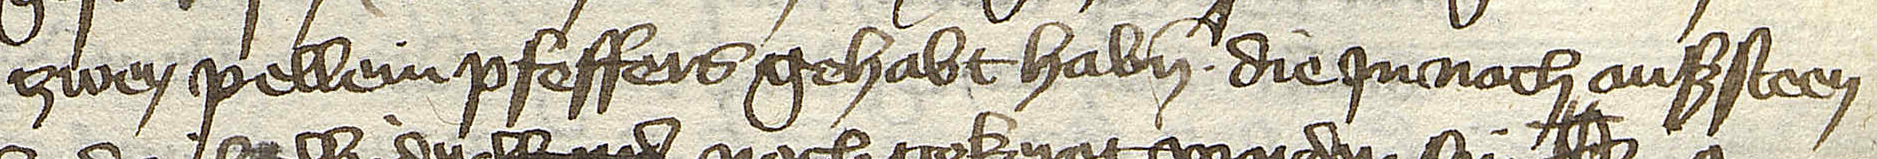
cʒwey pellein pfeffers gehabt hab*n . die In noch auſʒſteen
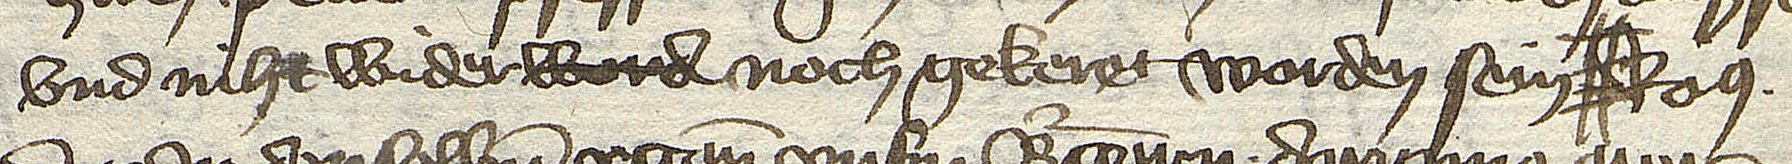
vnd niht wider word noch gekeret worden ſein Ro*
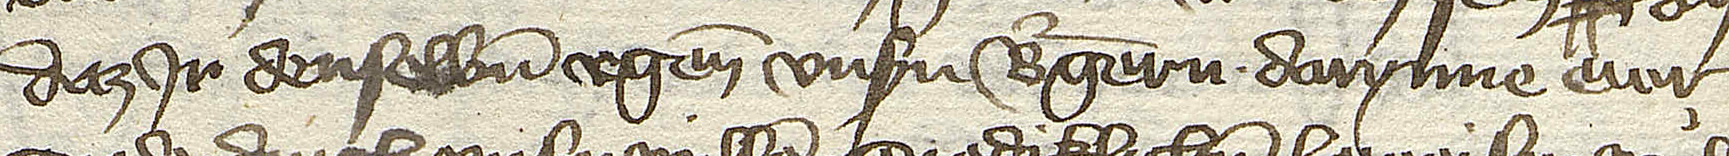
daʒ Ir denſelb*n egen* vnſ*n B*gern . darynne ewr
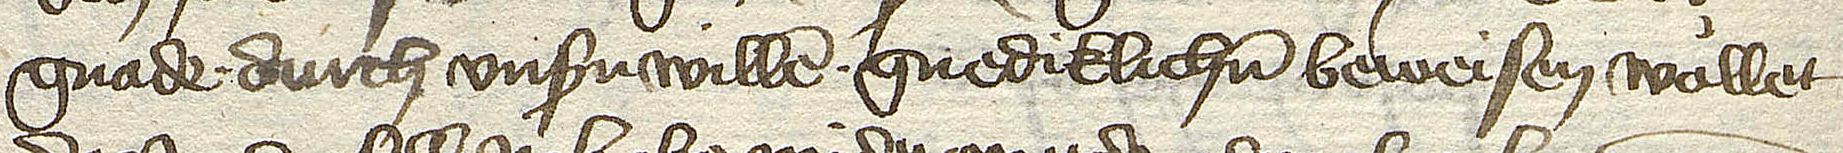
gnade . durch vnſ*r wille* . gnediklich*n beweiſen wöllet
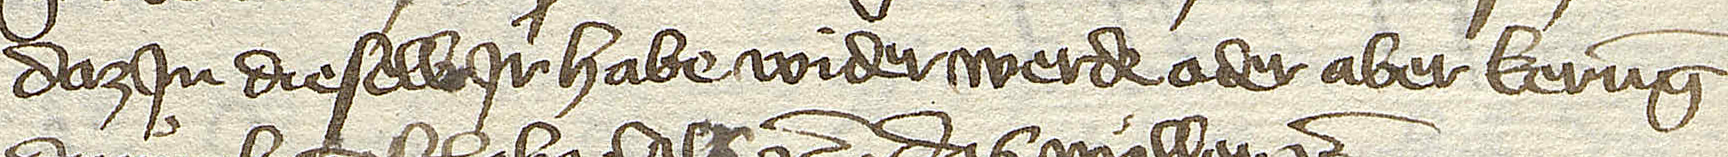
daʒ In dieſelb* Ir habe wider werde oder aber kerug*
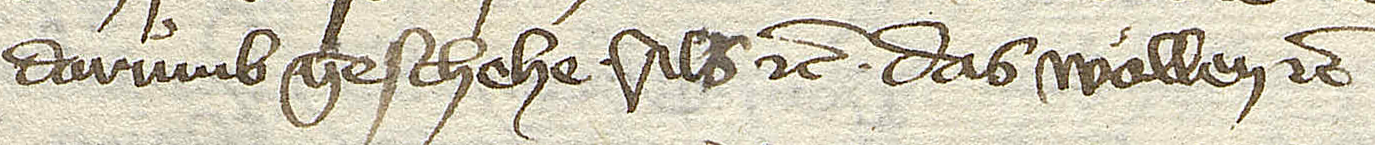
darümb geſchehe . Als ec* . das wöllen ec*
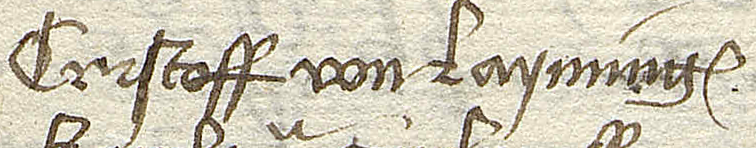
Criſtoff von Layming*
